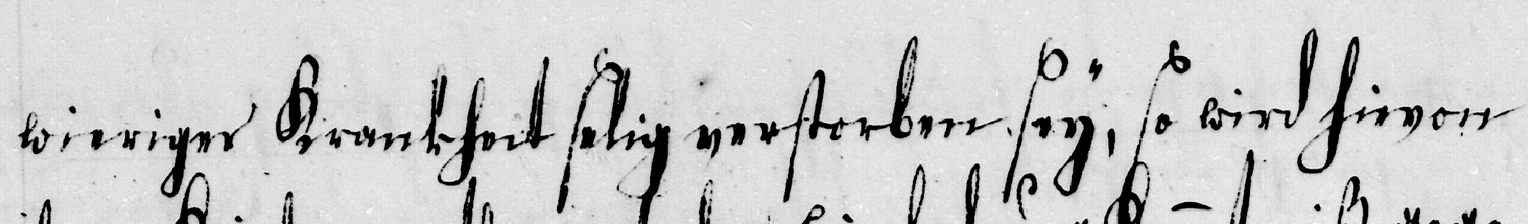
wieriger Krankheit selig verstorben sey, so wird hievon
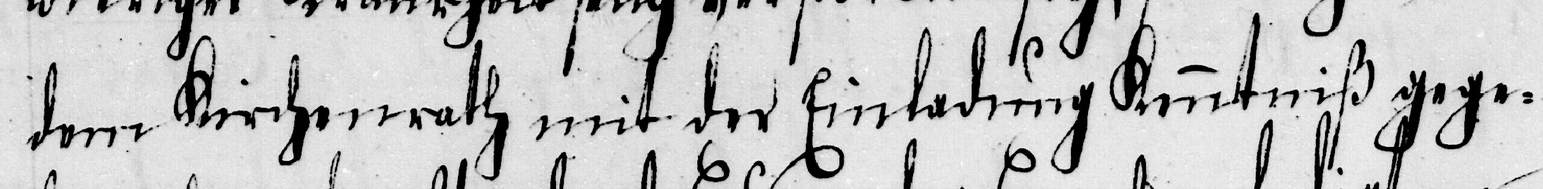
dem Kirchenrath mit der Einladung Kenntniß gege¬
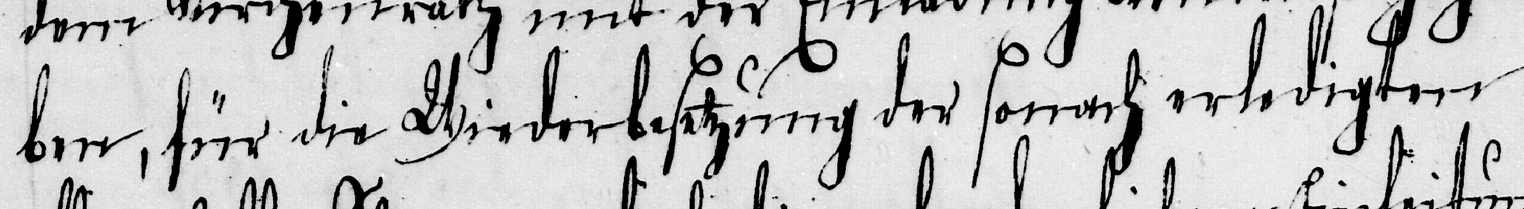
ben, für die Wiederbesetzung der sonach erledigten
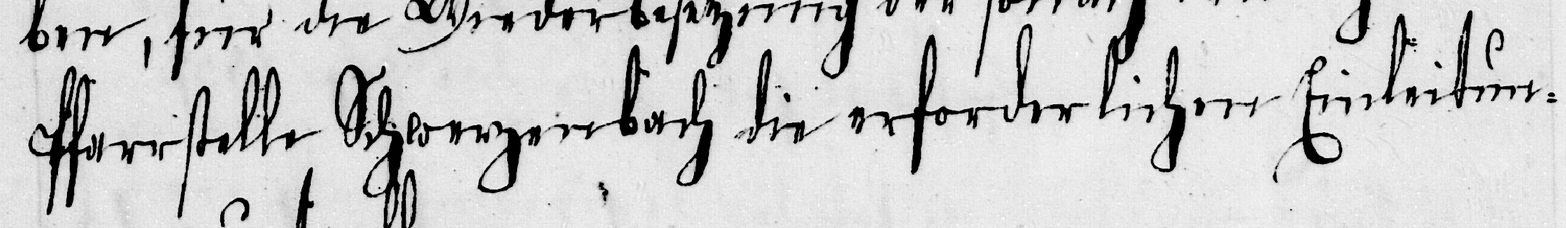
Pfarrstelle Schwerzenbach die erforderlichen Einleitun¬
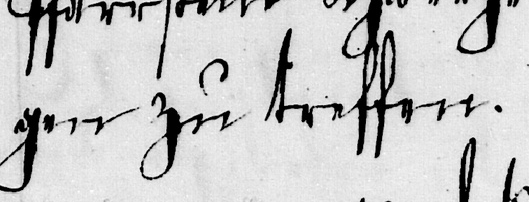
gen zu treffen.
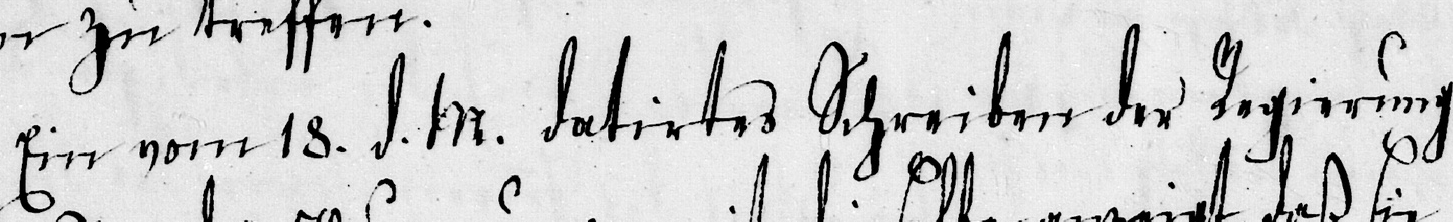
Ein vom 18. d. M. datirtes Schreiben der Regierung
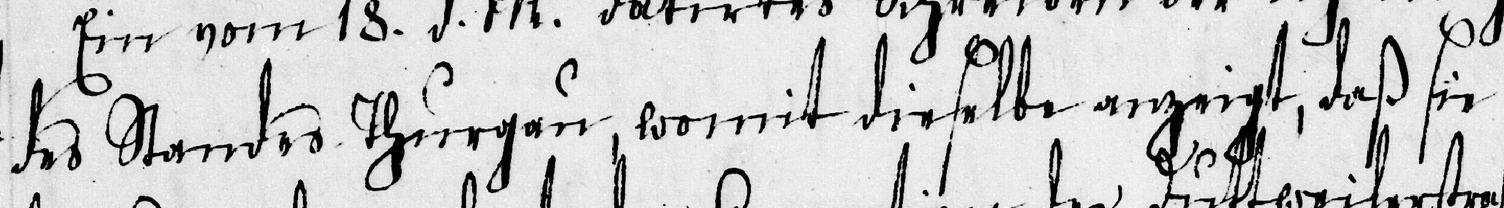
des Standes Thurgau, womit dieselbe anzeigt, daß sie
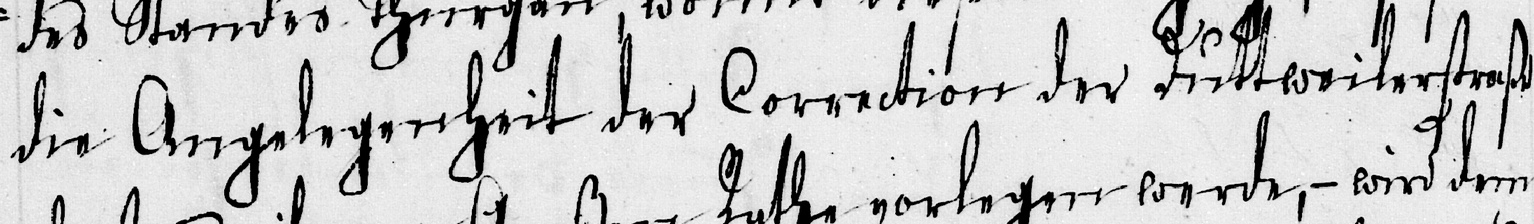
die Angelegenheit der Correction der Duttweilerstraße
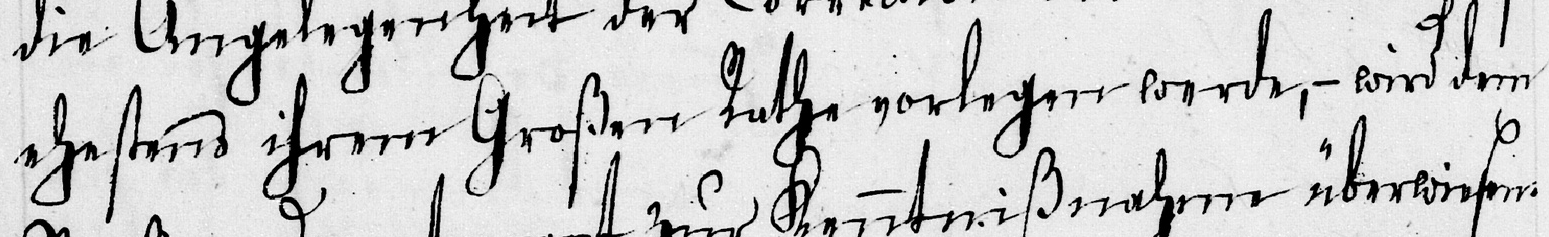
ehestens ihrem Großen Rathe vorlegen werde, – wird dem
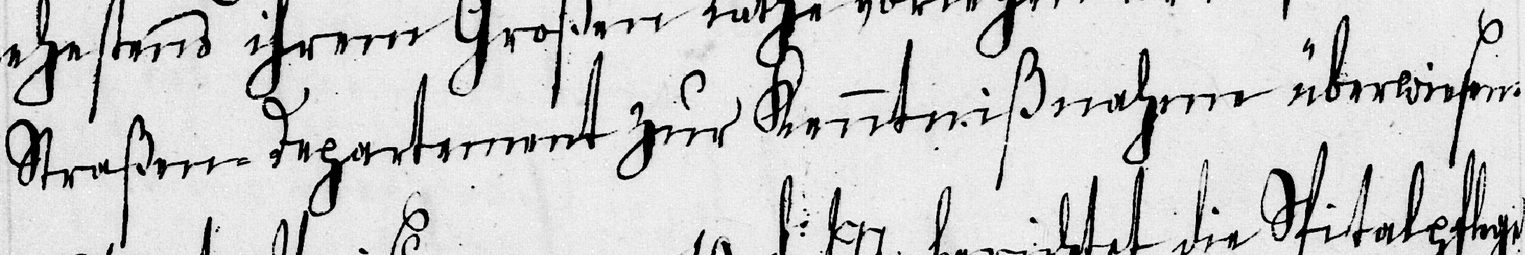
Straßen-Departement zur Kenntnißnahme überwiesen.
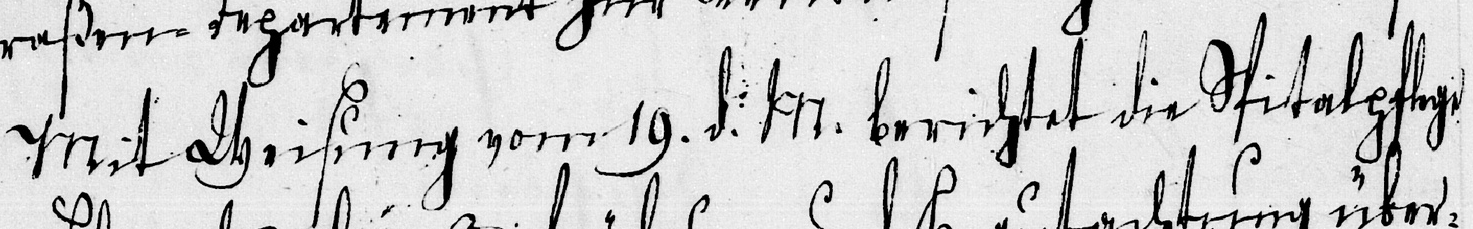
Mit Weisung vom 19. d. M. berichtet die Spitalpflege
